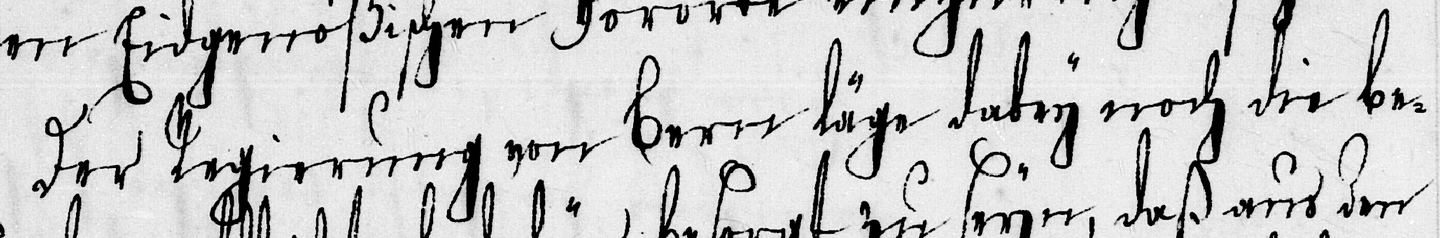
Der Regierung von Bern läge dabey noch die be¬
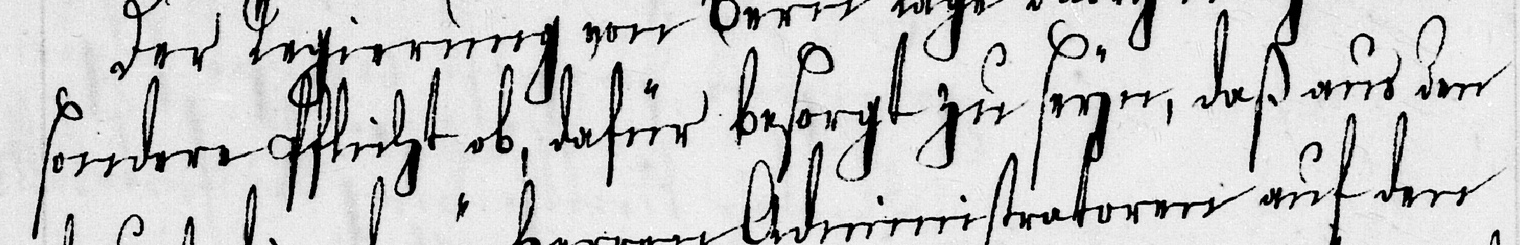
sondere Pflicht ob, dafür besorgt zu seyn, daß aus den
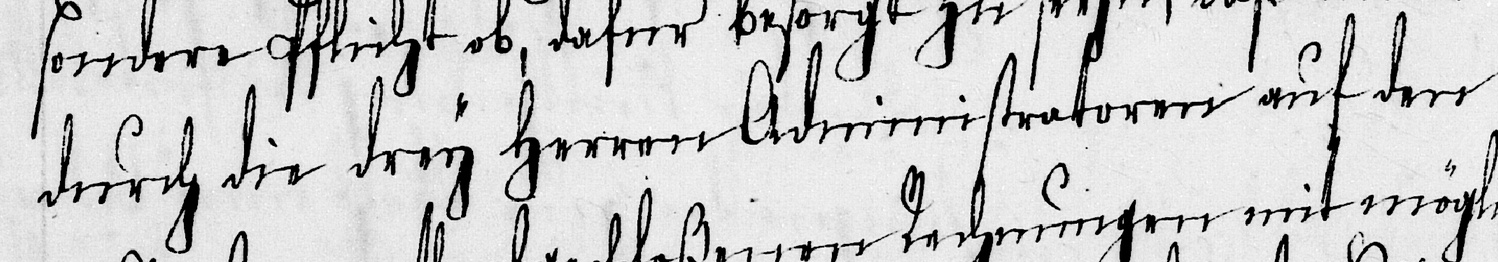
durch die drey Herren Administratoren auf den
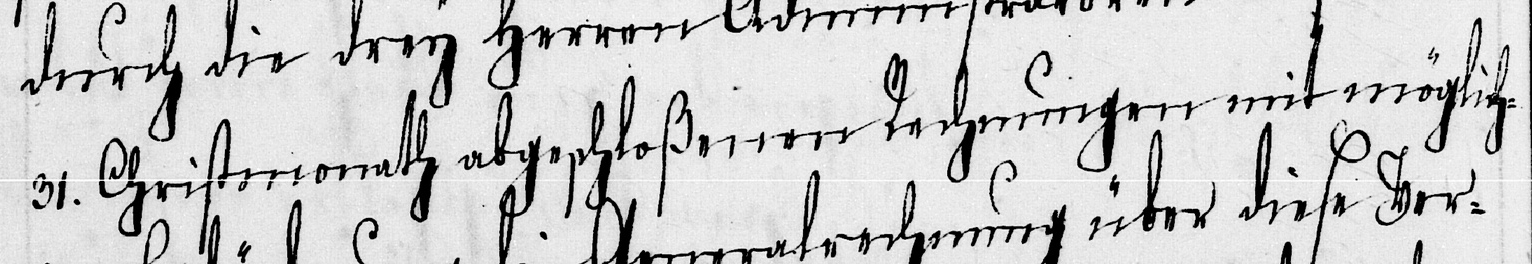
31. Christmonath abgeschloßenen Rechnungen mit möglich¬
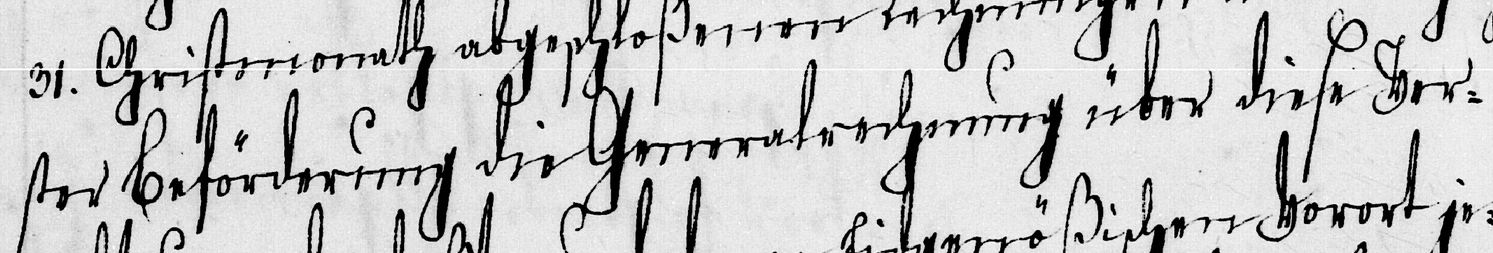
ster Beförderung die Generalrechnung über diese Ver¬
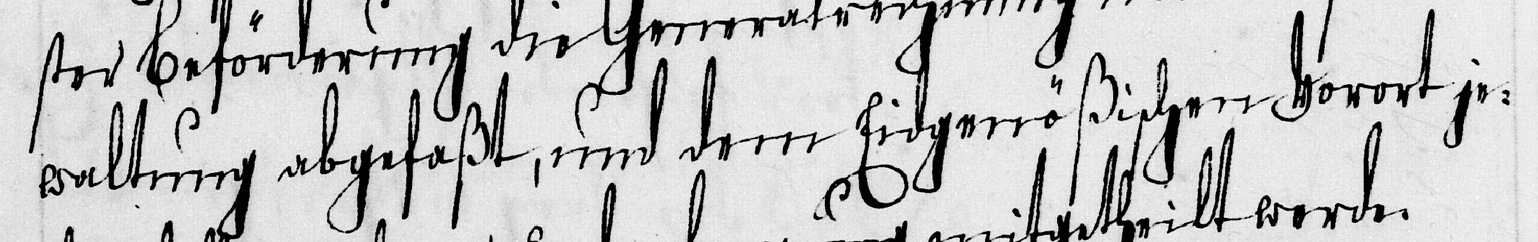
waltung abgefaßt, und dem Eidgenößischen Vorort je¬
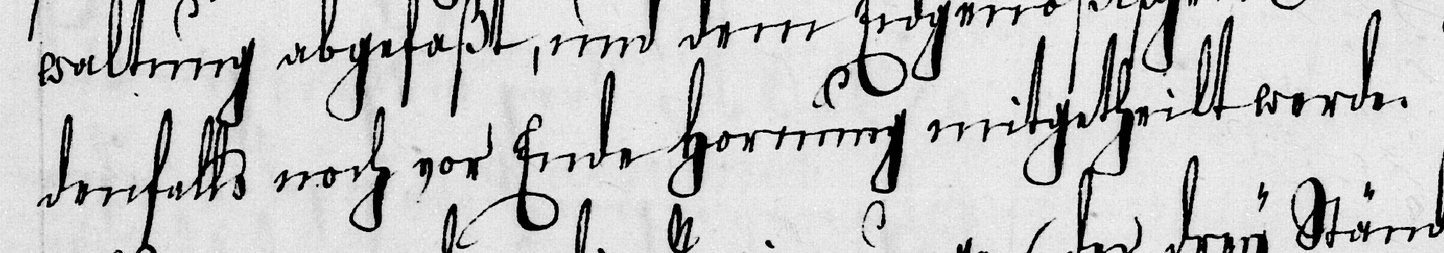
denfalls noch vor Ende Hornung mitgetheilt werde.
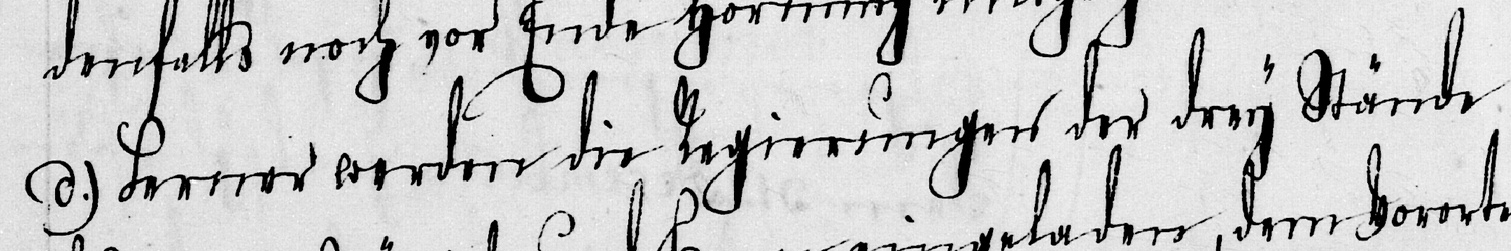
d.) Ferner werden die Regierungen der drey Stände
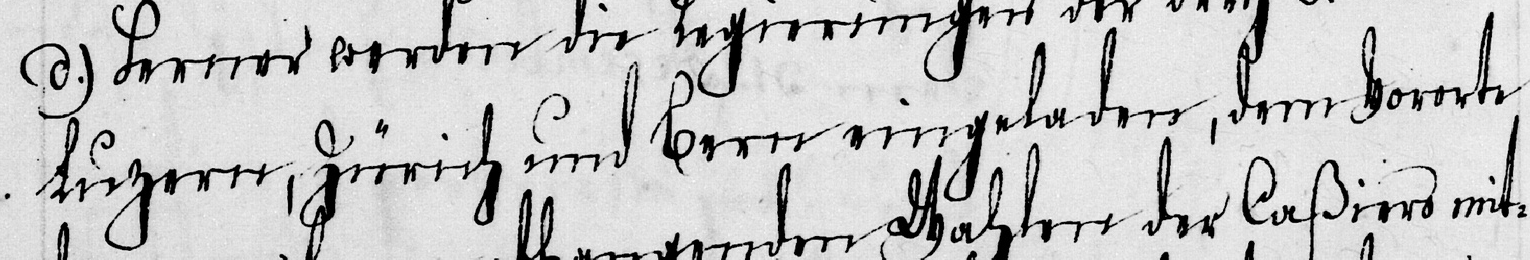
Luzern, Zürich und Bern eingeladen, dem Vororte
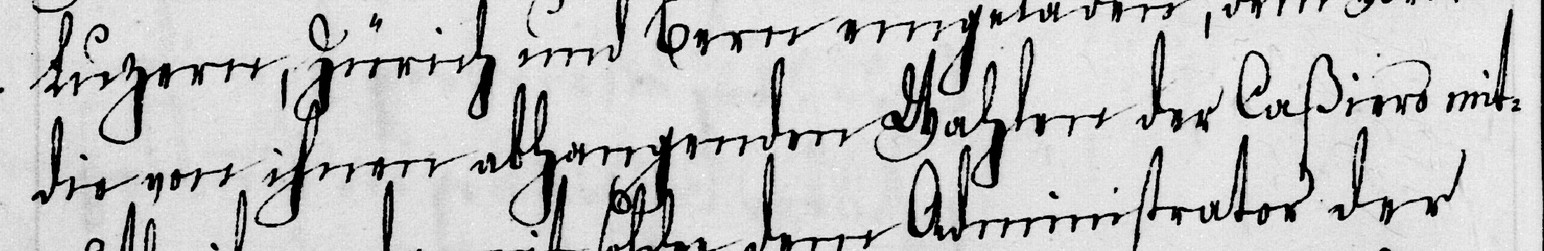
die von ihnen abhangenden Wahlen der Caßiers mit¬
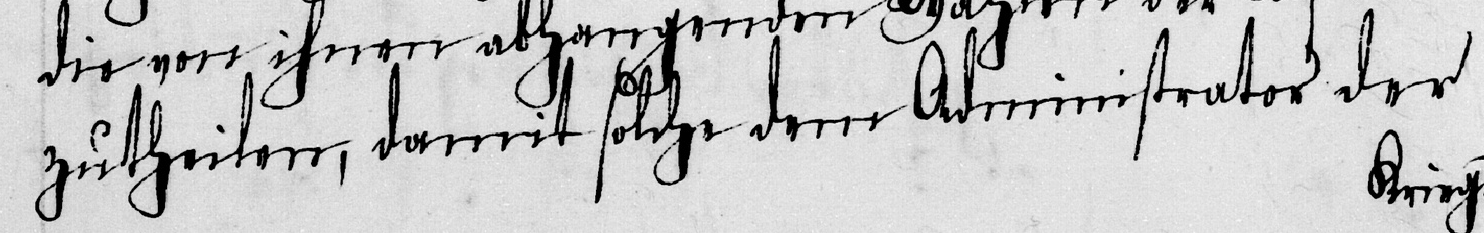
zutheilen, damit solche dem Administrator der
